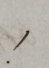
1843.
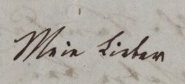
Mein Lieber!
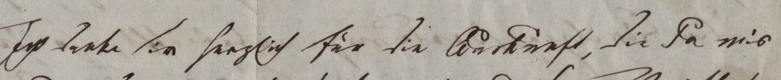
Ich danke Dir herzlich für die Auskunft, die Du mir
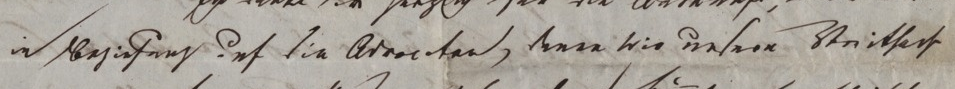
in Beziehung auf die Advocaten, denen wir unsere Streitsache
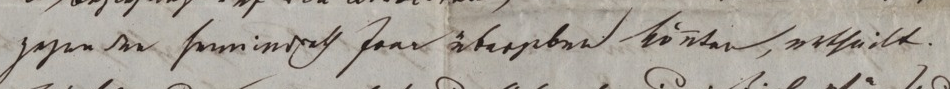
gegen den Gemeindrath Jona übergeben könnten, ertheilt.
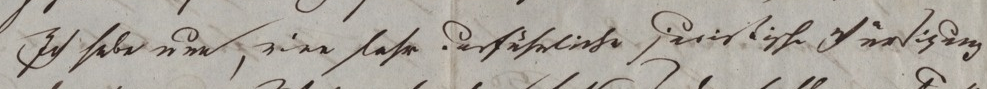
Ich habe nun, eine sehr ausführliche juristische Würdigung
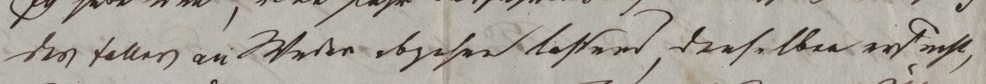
des Falles an Weder abgehen lassen, denselben ersucht,
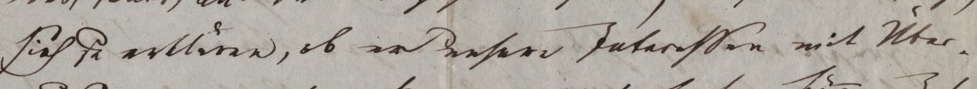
sich zu erklären, ob er unsere Interessen mit Über-
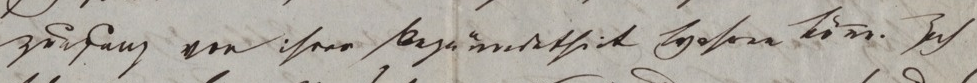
zeugung von ihrer Begründetheit wahren könne. Ich
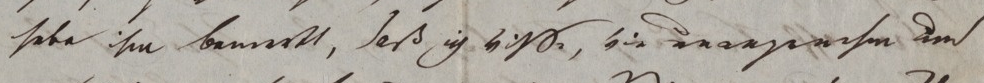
habe ihm bemerkt, daß ich wisse, wie unangenehm und
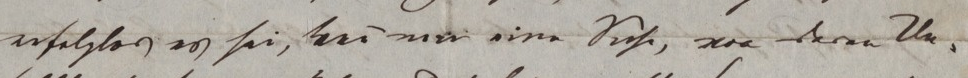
erfolglos es sei, wenn man eine Sache, von deren Un-
